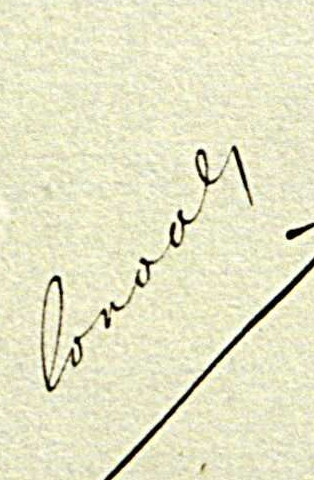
lonool,
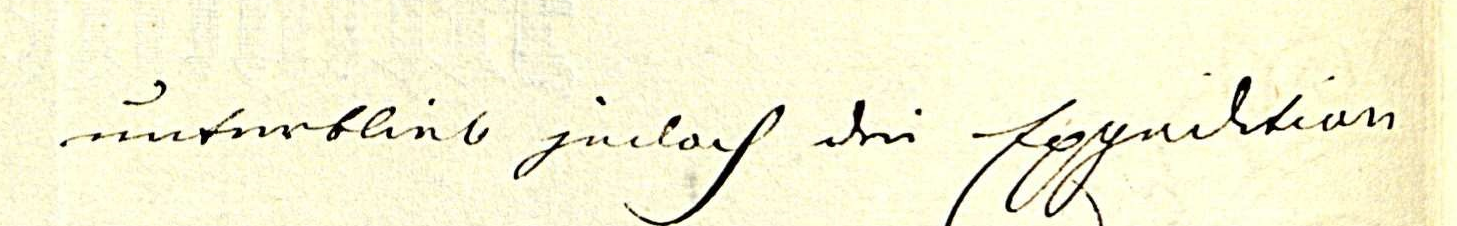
unterblieb jedoch die Expedition
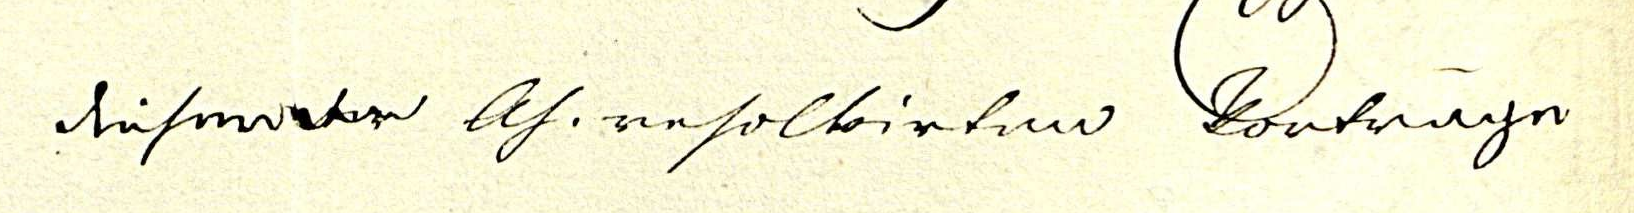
diesen Ah resolvirten Vorträge
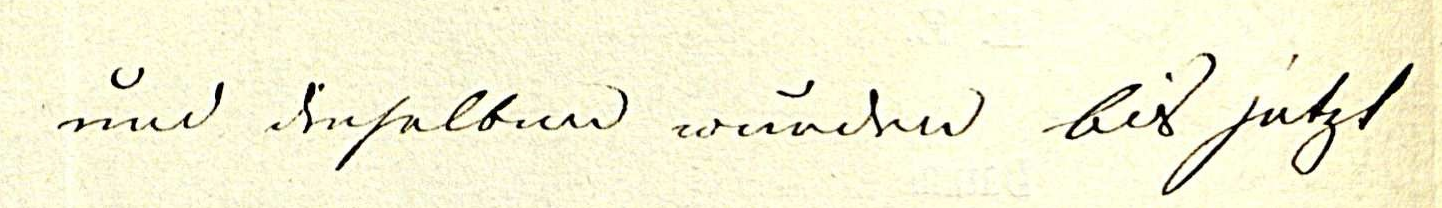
und dieselben wuren bis jetzt
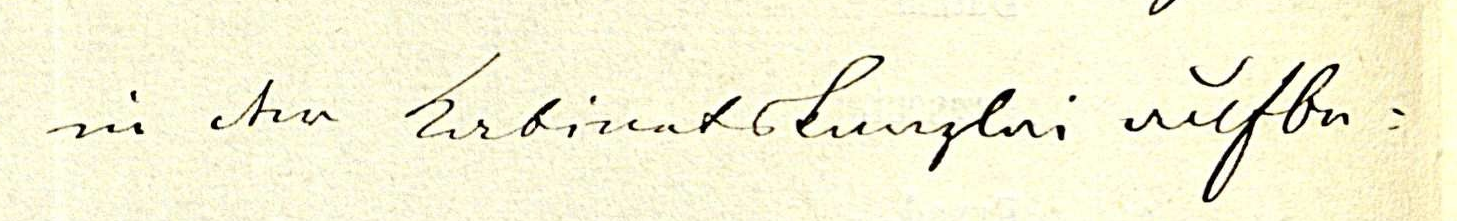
in der Kabinetskanzlei aufbe¬
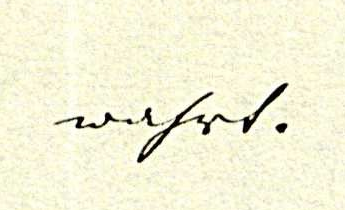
wahrt.
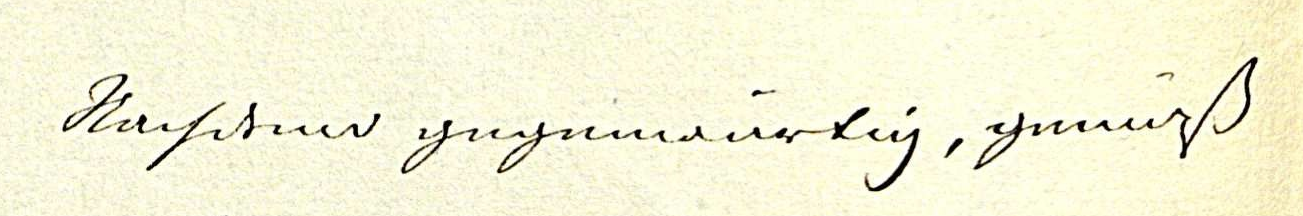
Nachdem gegenwärtig, gemäß
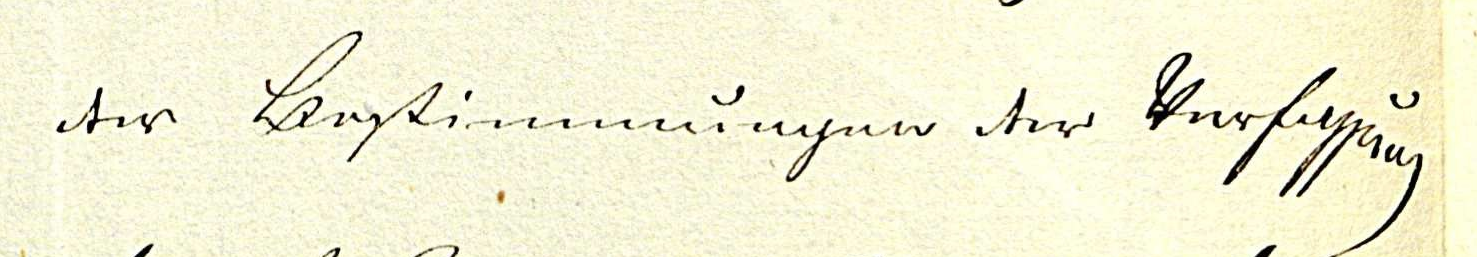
der Bestimmungen der Verfassung
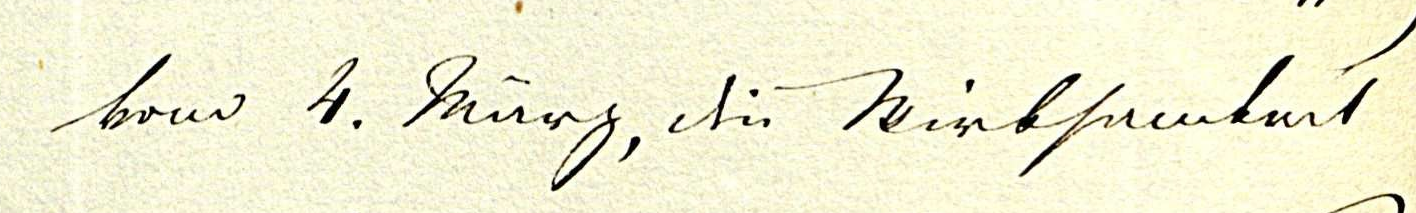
von 4. März, die Wirksamkeit
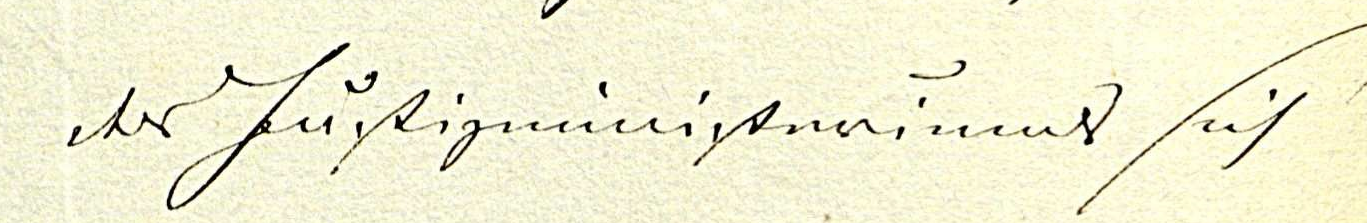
des Justizministeriums ist
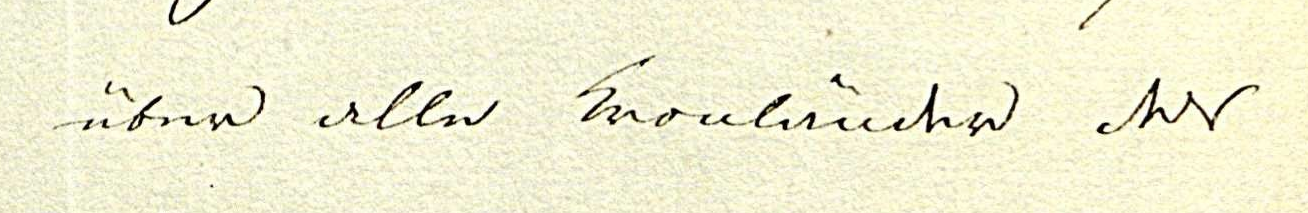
über alle Kronländer der
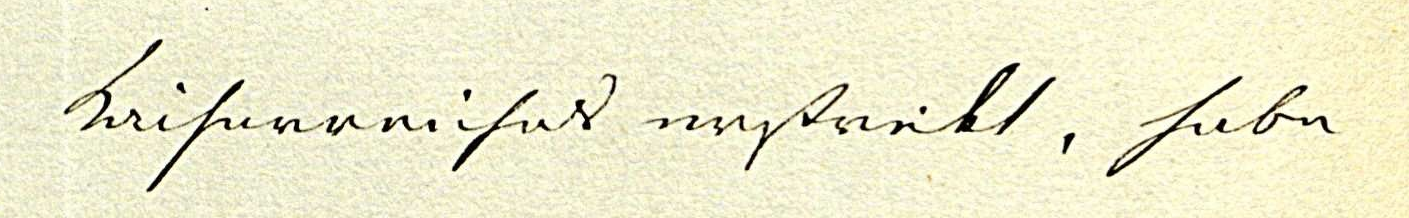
Kaiserreiches erstreckt, habe
